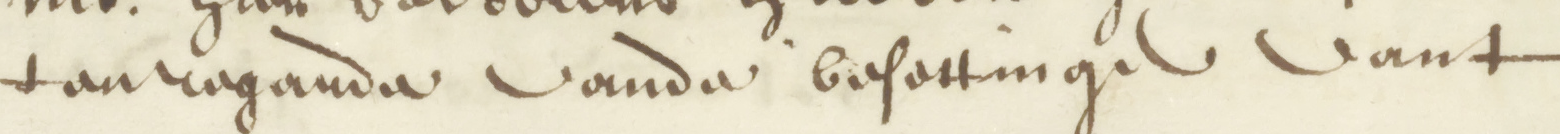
ten regarde vande besettinge vant
